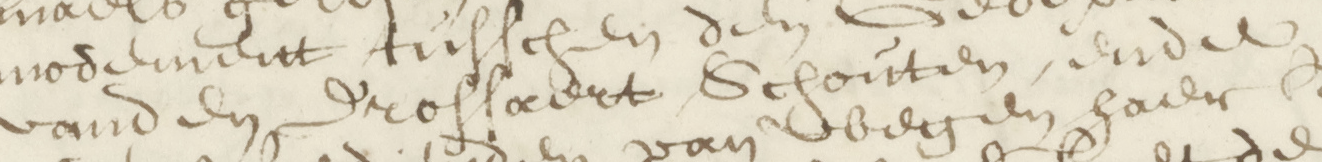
vanden Drossaert Schouten, ende
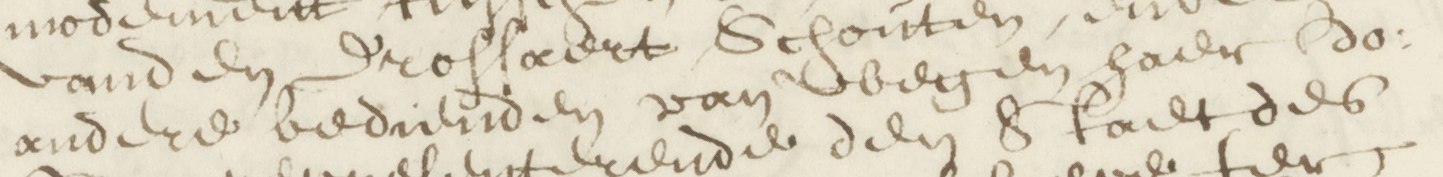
andere bedienden van wegen haer ho:
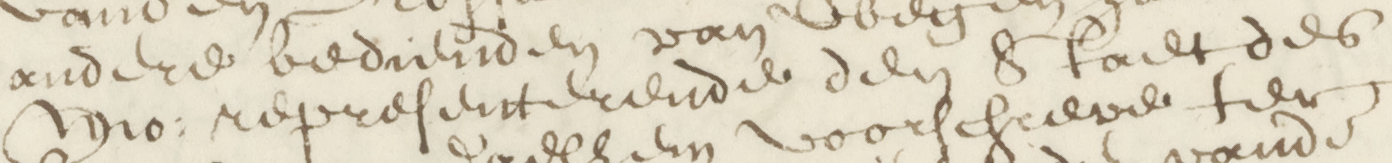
Mo: representerende den Staet des
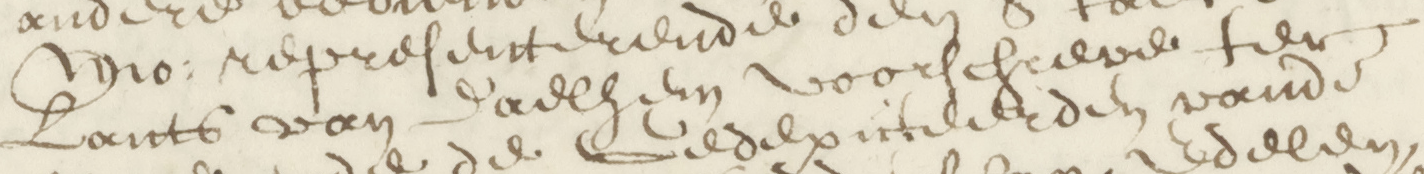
Lants van Daelhem voorschreve ter
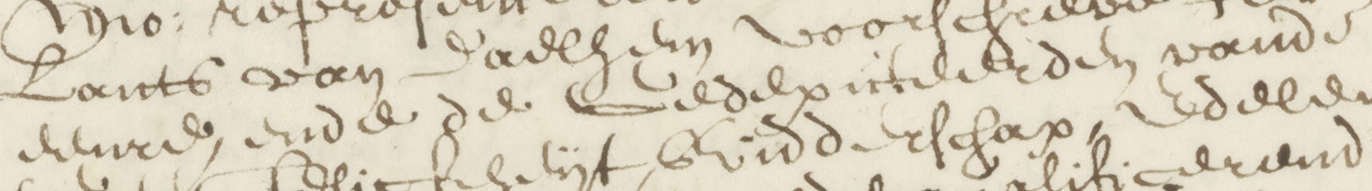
eenre, ende de Gedeputeerden vande
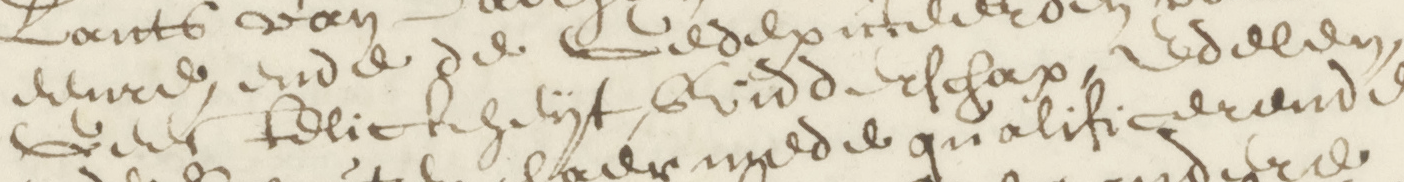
Geestelickheijt, Ridderschap, Edelen,
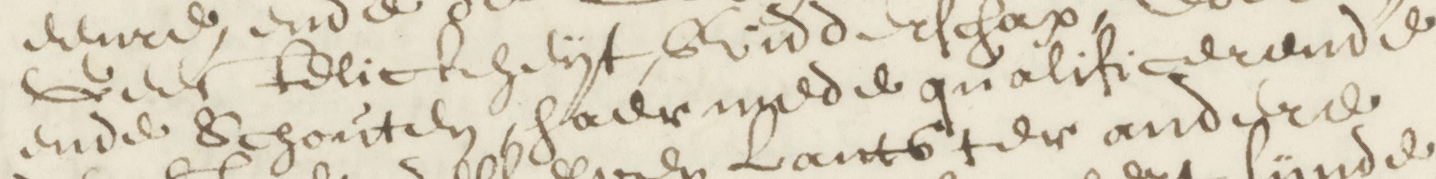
ende Schouten, haer mede qualificerende
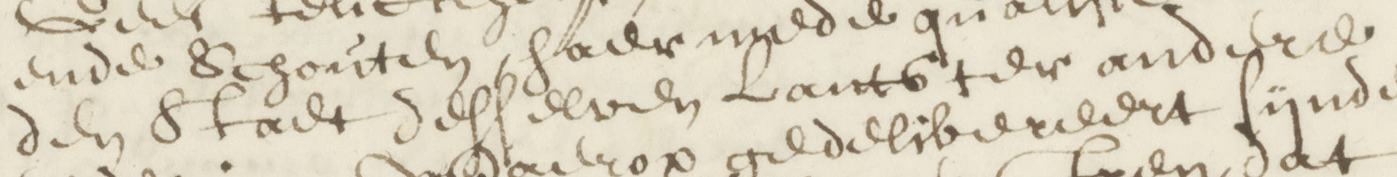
den Staet desselven Lants ter andere
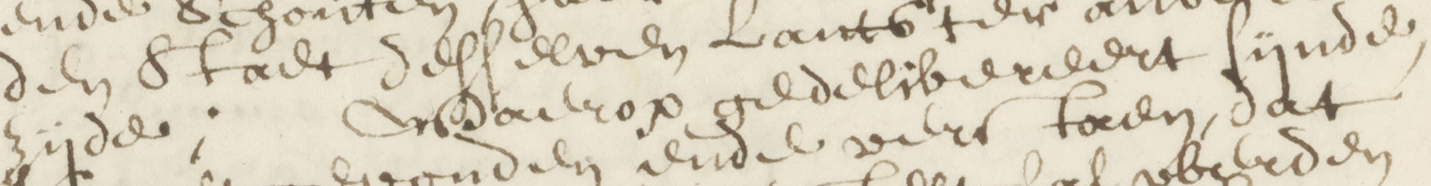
zijde: Waerop gedelibereert sijnde,
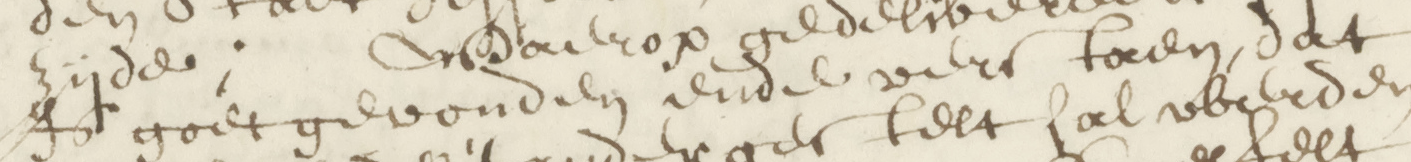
is goetgevonden ende verstaen, dat
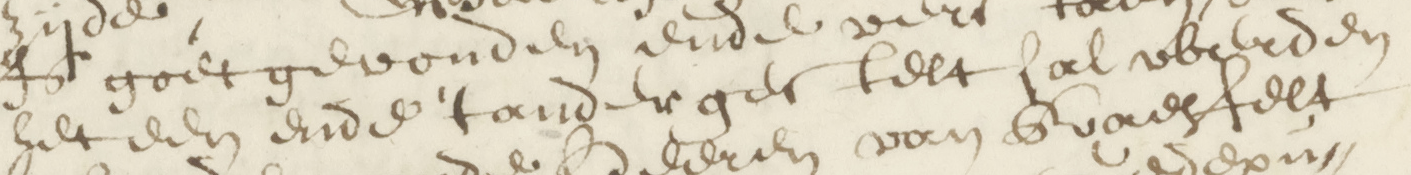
het een ende 't ander gestelt sal werden
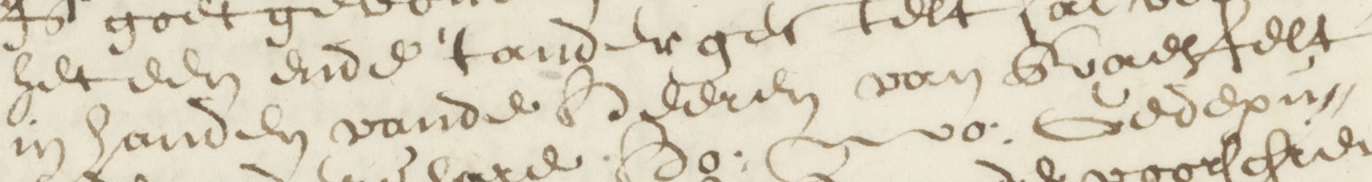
in handen vande Heeren van Raesfelt
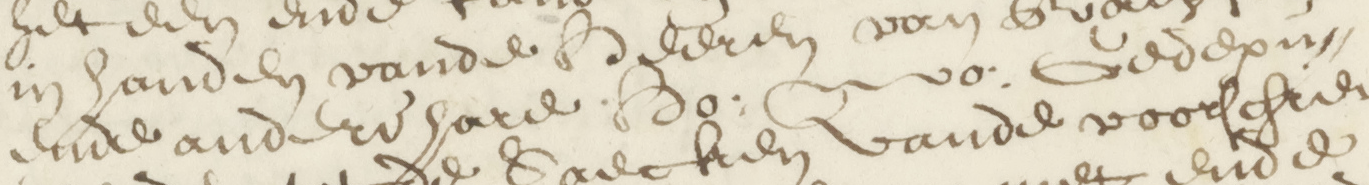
ende andere hare ho:Mo: Gedepu„
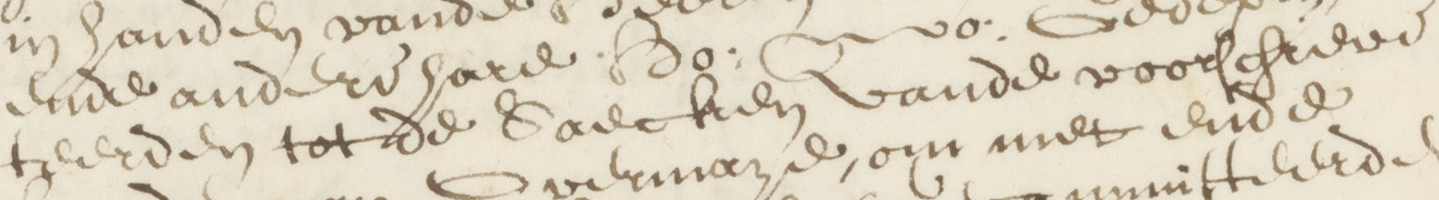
teerden tot de Saecken vande voorschreve
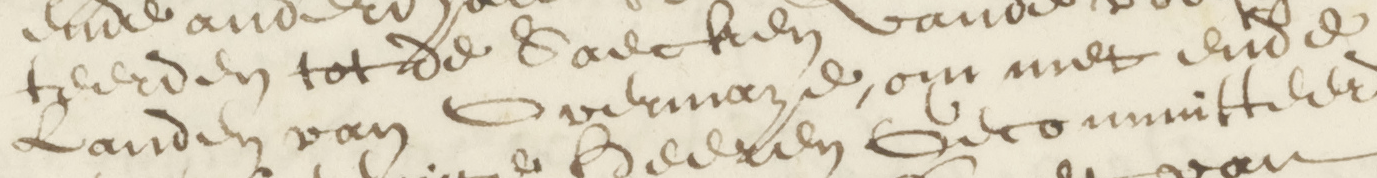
Landen van Overmaze, om met ende
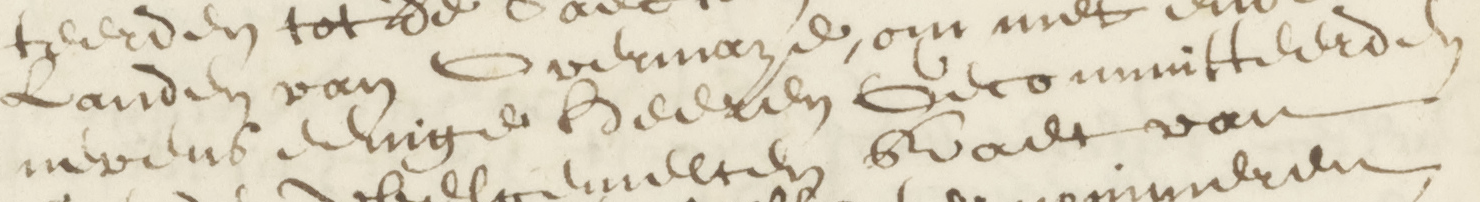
nevens eenige Heeren Gecommitteerden
